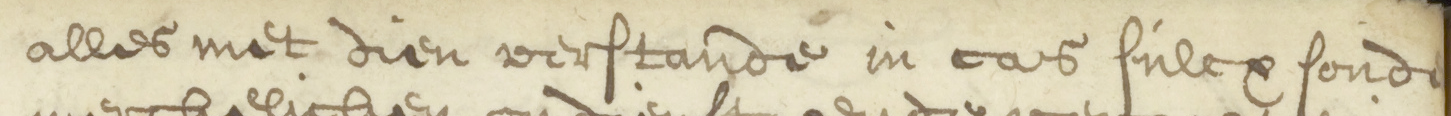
alles met dien verstande in cas sulcx soude
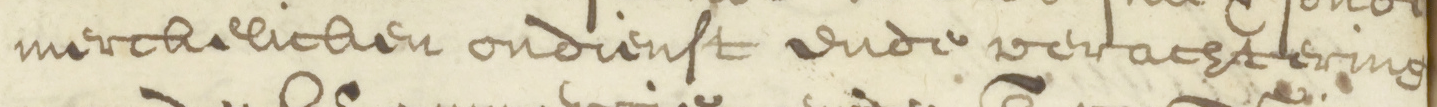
merckelicken ondienst ende verachtering
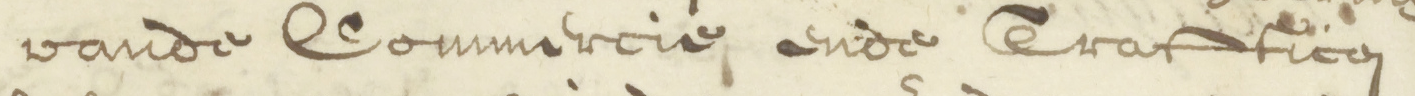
vande Commercie ende Trafficq
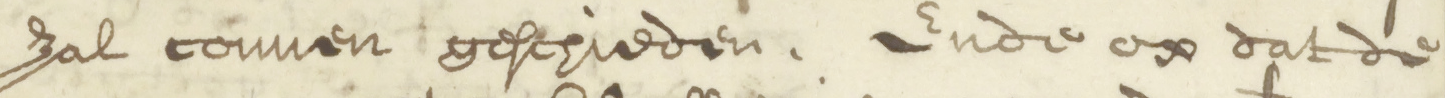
zal connen geschieden. Ende op dat de
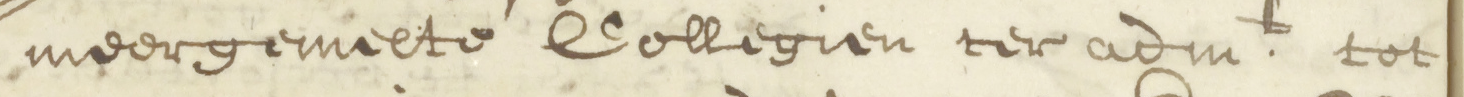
meergemelte Collegien ter admt. tot
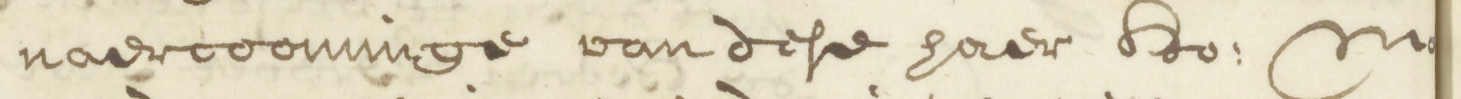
naercoominge van dese haer Ho:Mo:
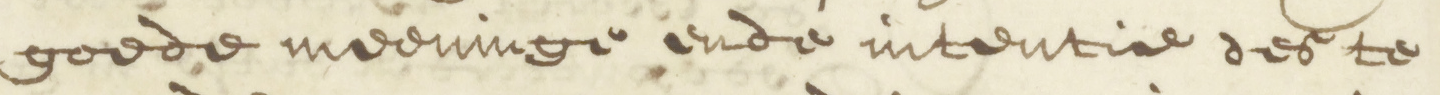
goede meeninge ende intentie des te
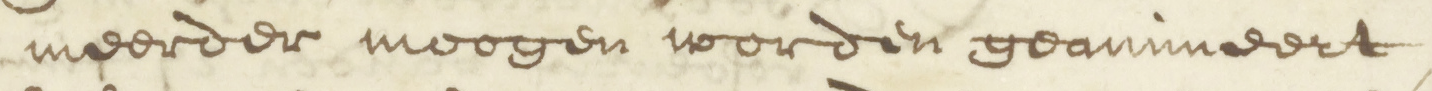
meerder moogen worden geanimeert,
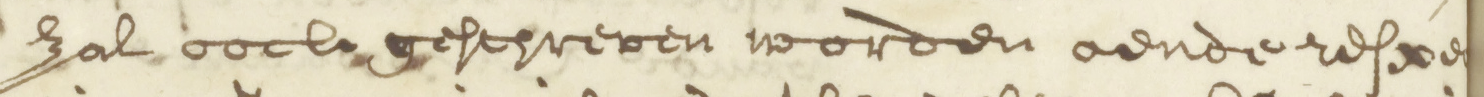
zal oock geschreven worden aen de respe
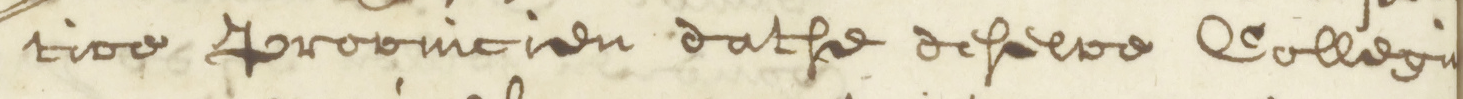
tive Provincien datse deselve Collegi
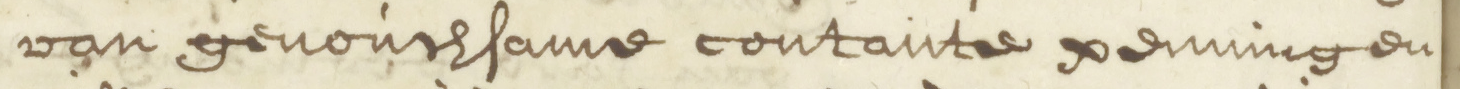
van genouchsame contante penningen
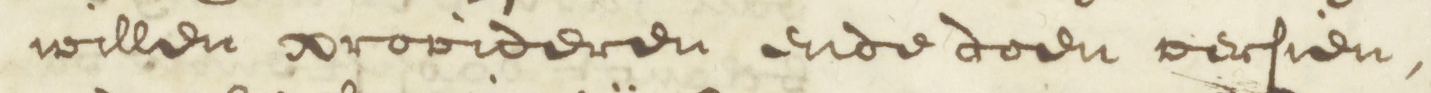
willen provideren ende doen versien,
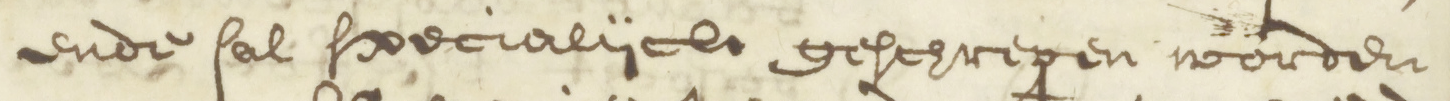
ende sal specialijck geschreven worden
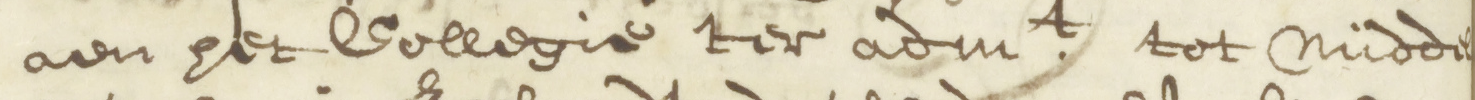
aen het Collegie ter admt. tot Middel„
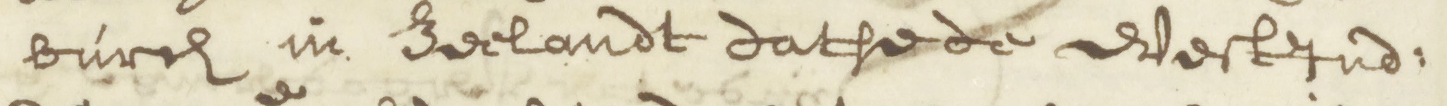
burch in Zeelandt datse de WestInd:
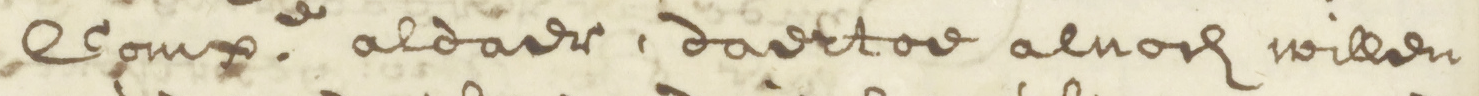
Compe. aldaer, daertoe alnoch willen
